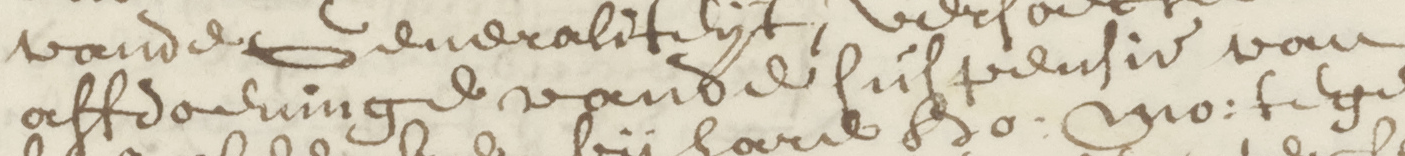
affdoeninge vande suspensie van
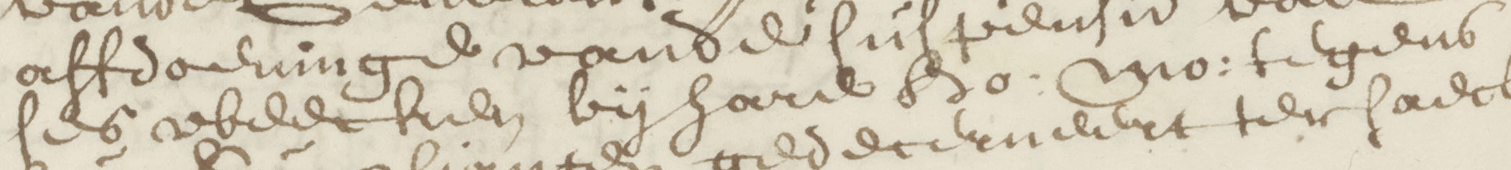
ses weecken bij hare Ho:Mo: tegens
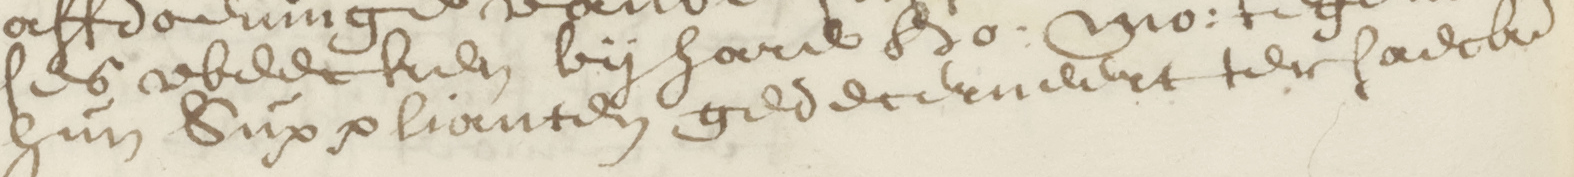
hun Supplianten gedecerneert ter saecke
